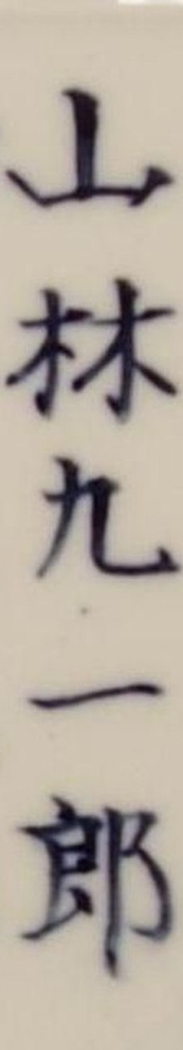山林九一郎
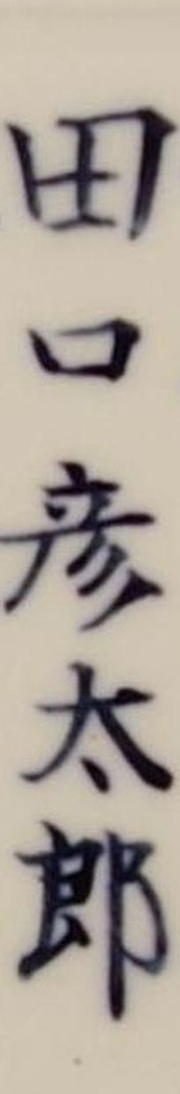田口彦太郎
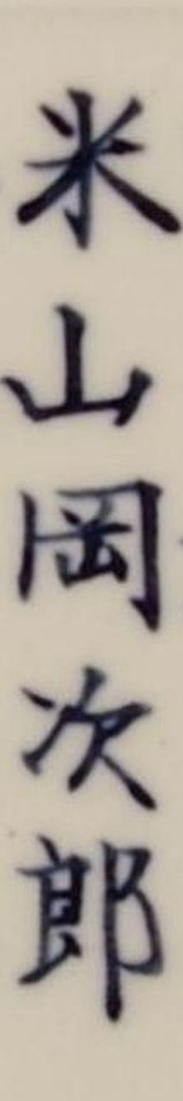米山岡次郎
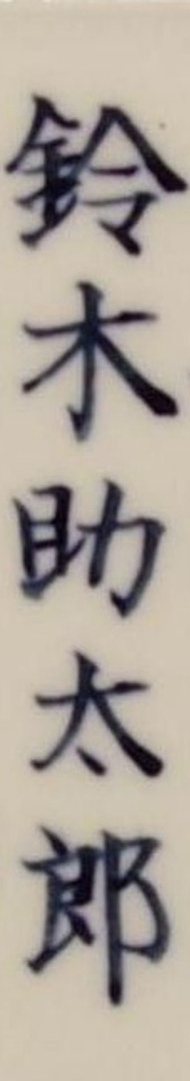鈴木助太郎
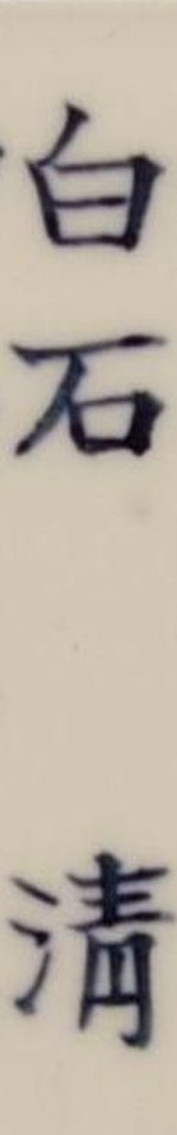白石清
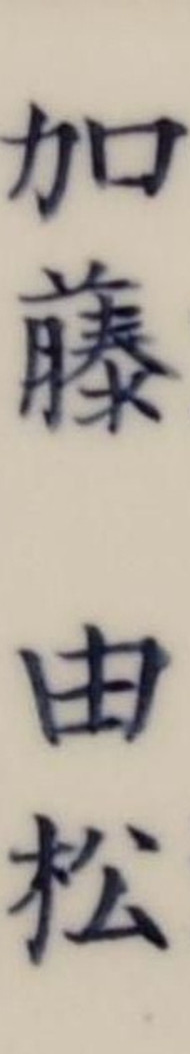加藤由松
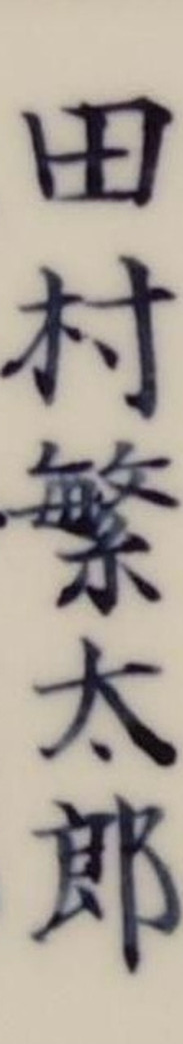田村繁太郎
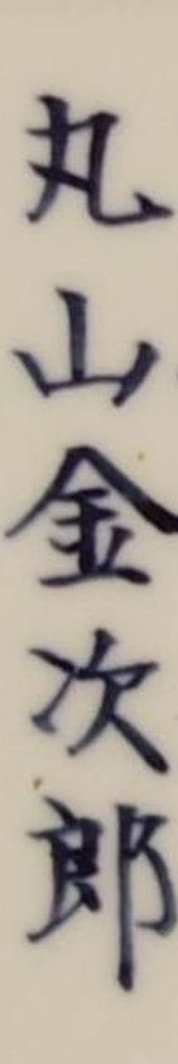丸山金次郎
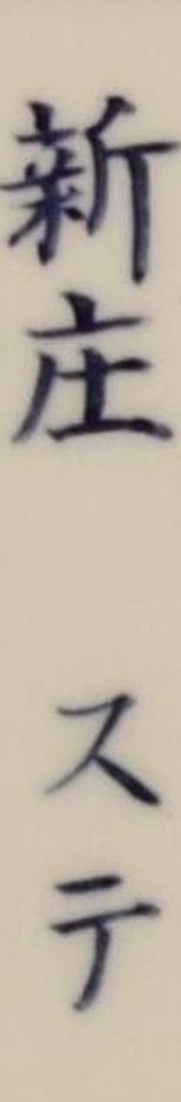新庄ステ
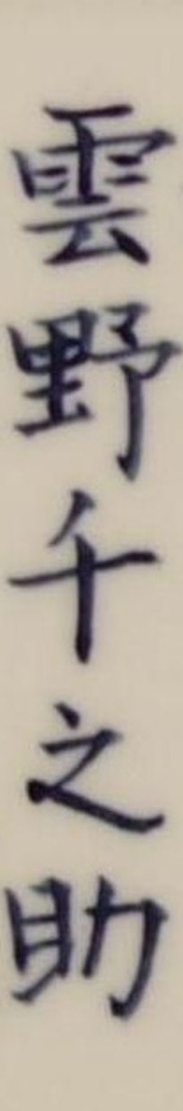雲野千之助
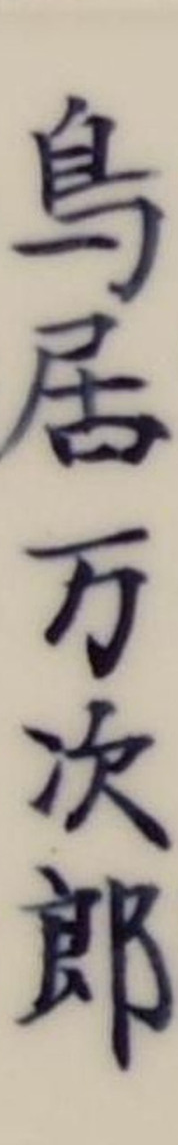鳥居万次郎
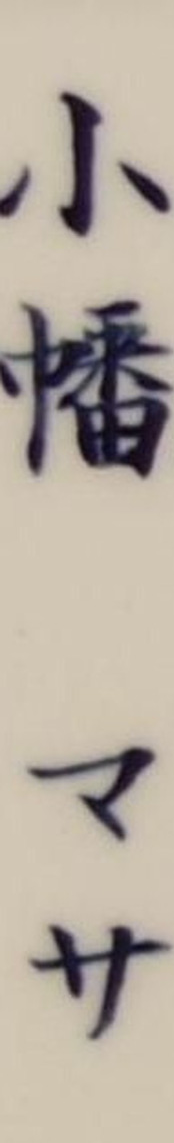小幡マサ
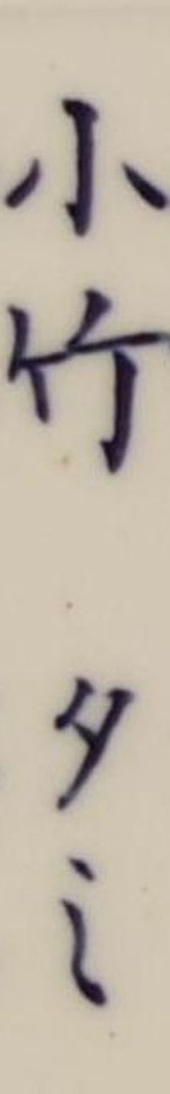小竹タミ
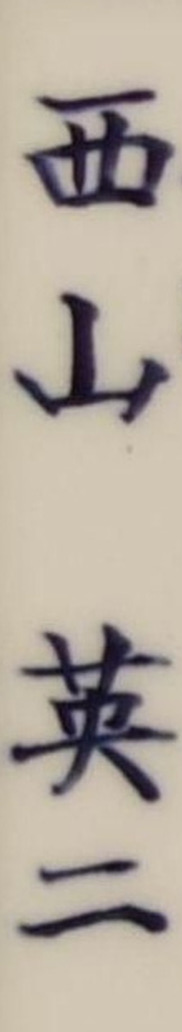西山英二

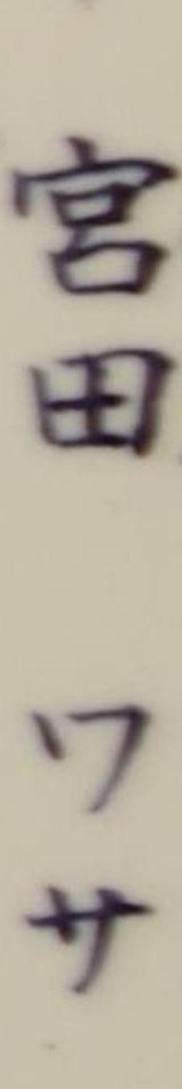宮田ワサ
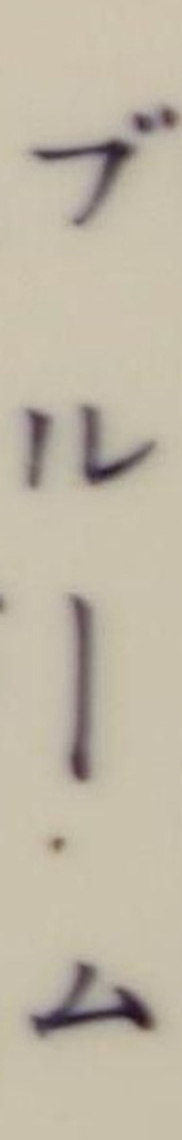ブルーム
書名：E~L
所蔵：高野山金剛峯寺
